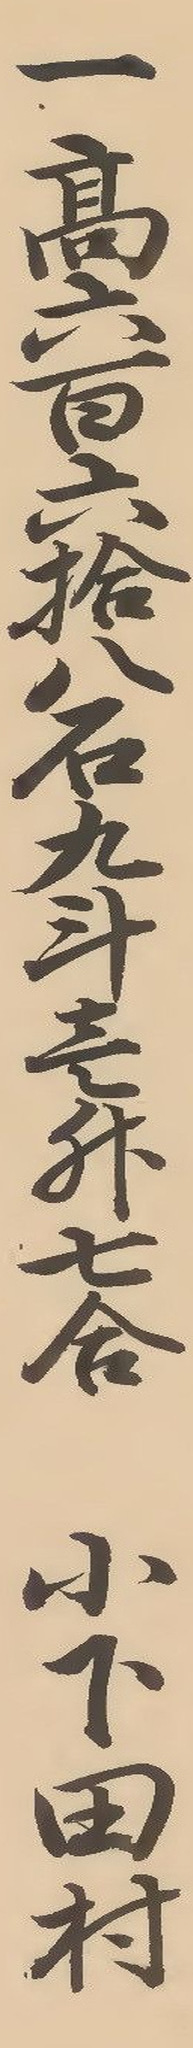一高六百六拾八石九斗壱升七合小下田村
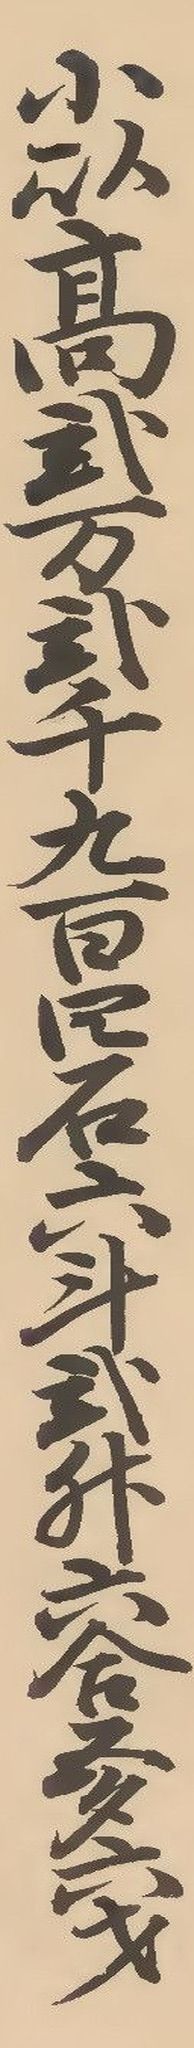小以高弐万弐千九百四石六斗弐升六合五勺六才

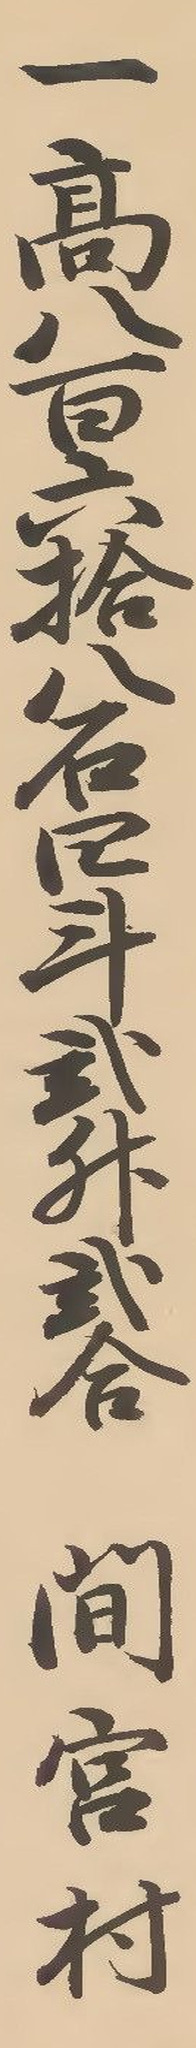一高八百六拾八石四斗弐升弐合間宮村
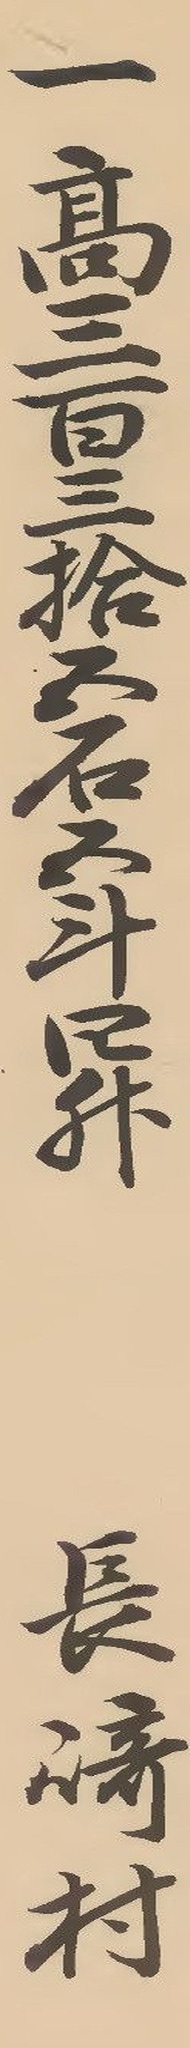一高三百三拾五石五斗四升長崎村
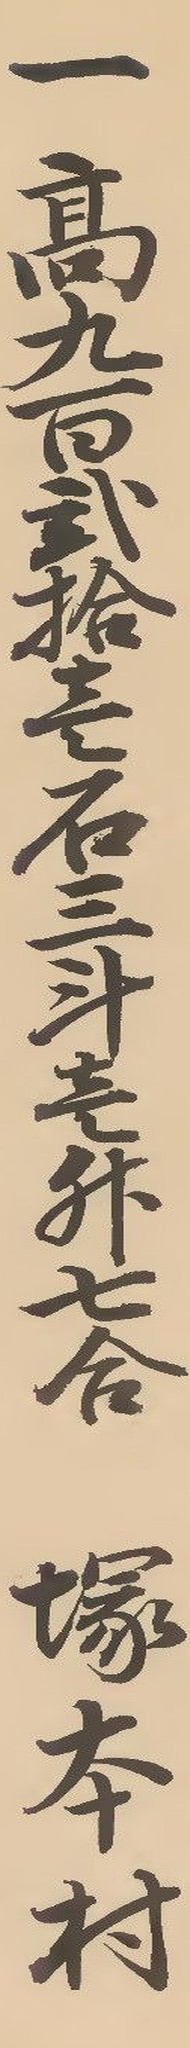一高九百弐拾壱石三斗壱升七合塚本村
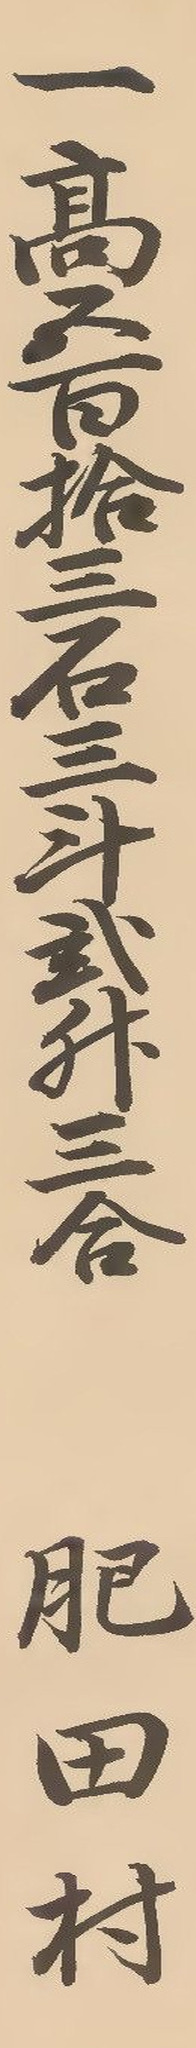一高五百拾三石三斗弐升三合肥田村
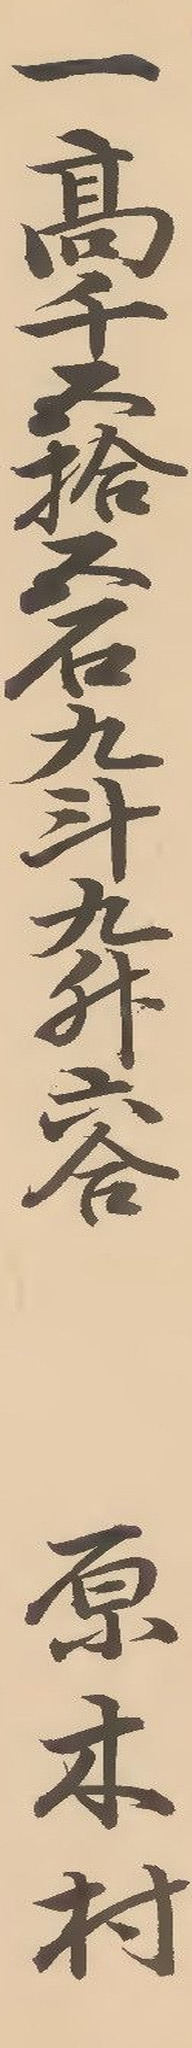一高千五拾五石九斗九升六合原木村
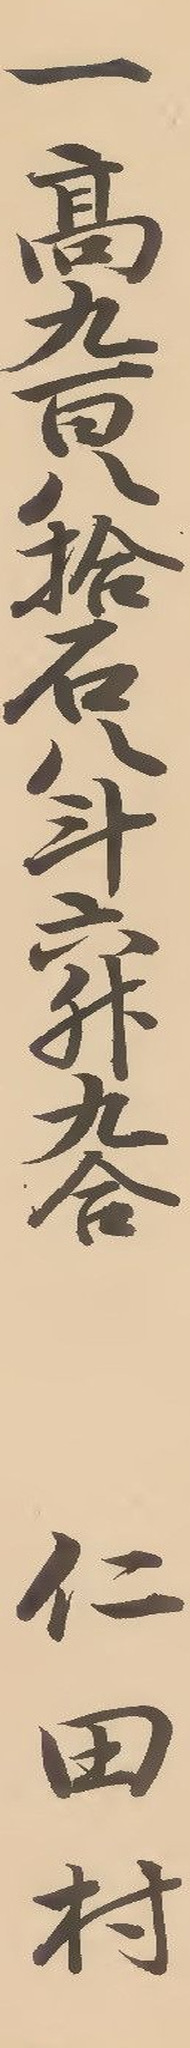一高九百八拾石八斗六升九合仁田村
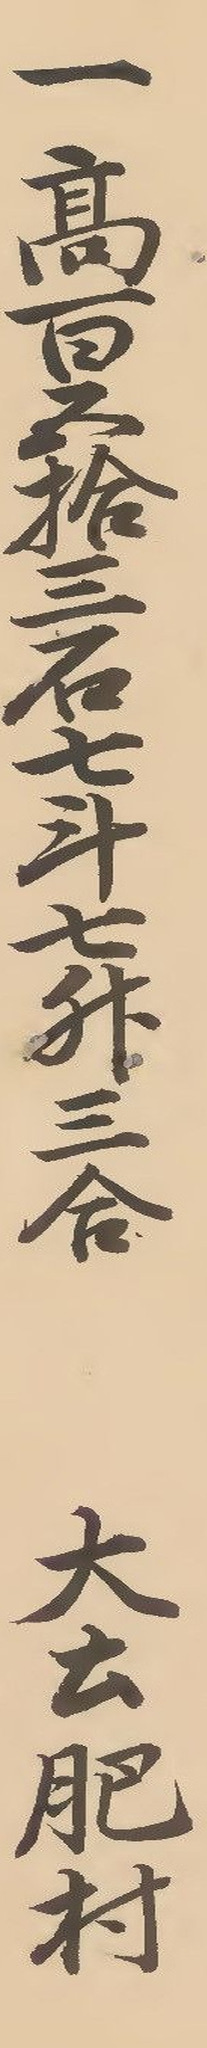一高百五拾三石七斗七升三合大土肥村

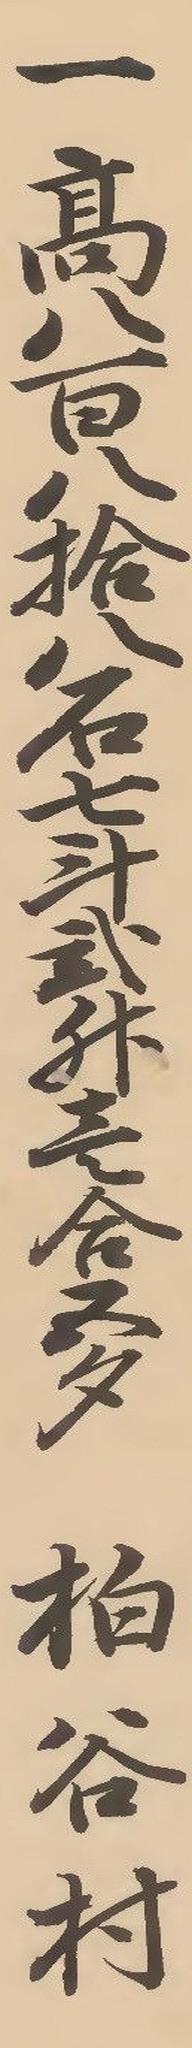一高八百八拾八石七斗弐升壱合五勺柏谷村
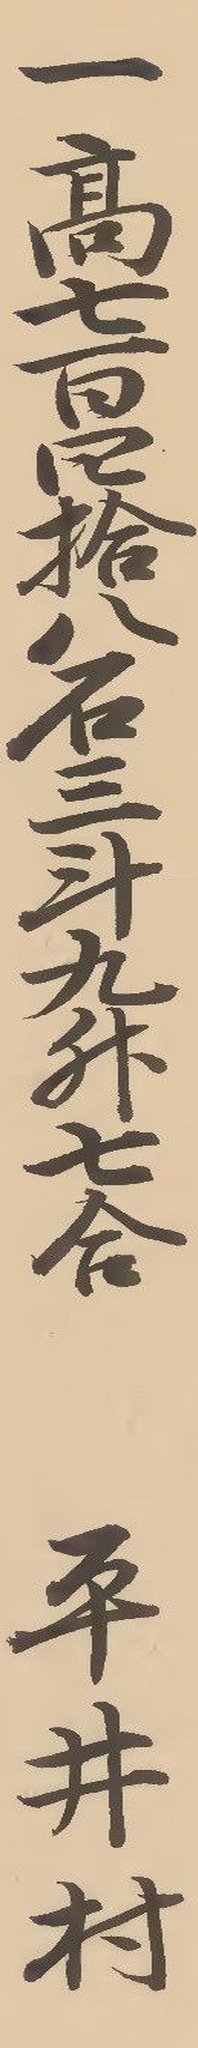一高七百四拾八石三斗九升七合平井村
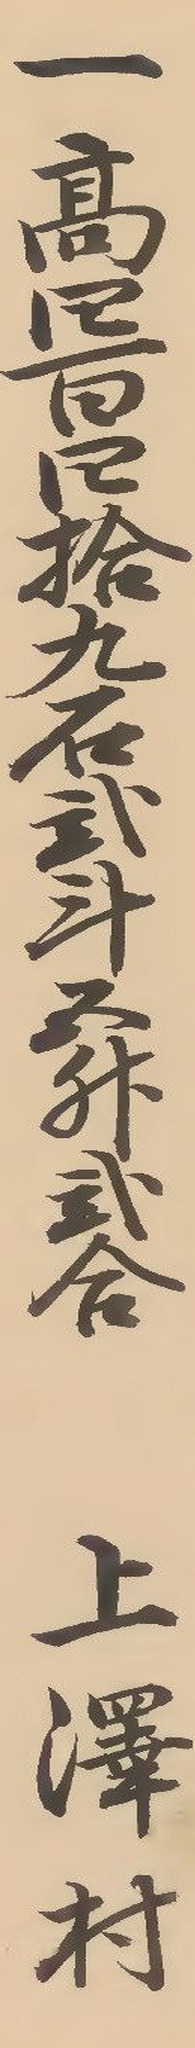一高四百四拾九石弐斗五升弐合上沢村
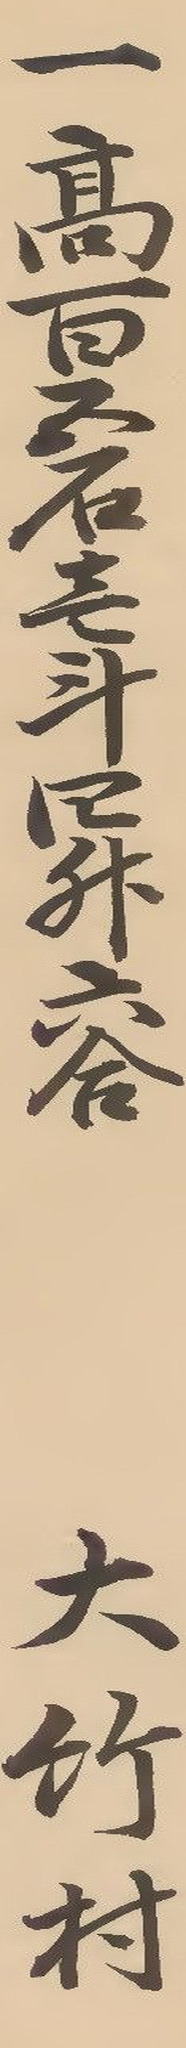一高百五石壱斗四升六合大竹村
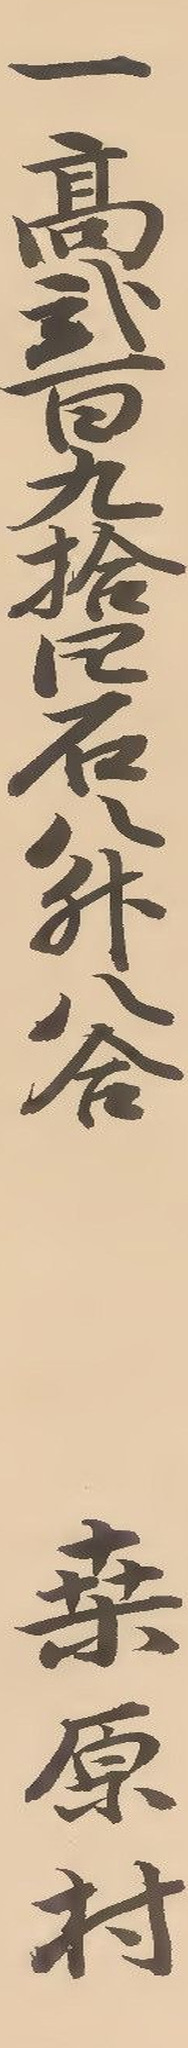一高弐百九拾四石八升八合桑原村
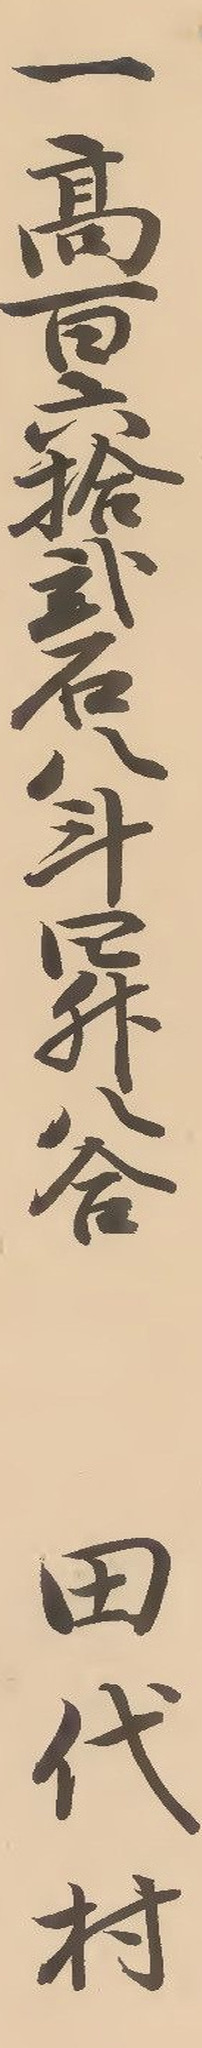一高百六拾弐石八斗四升八合田代村
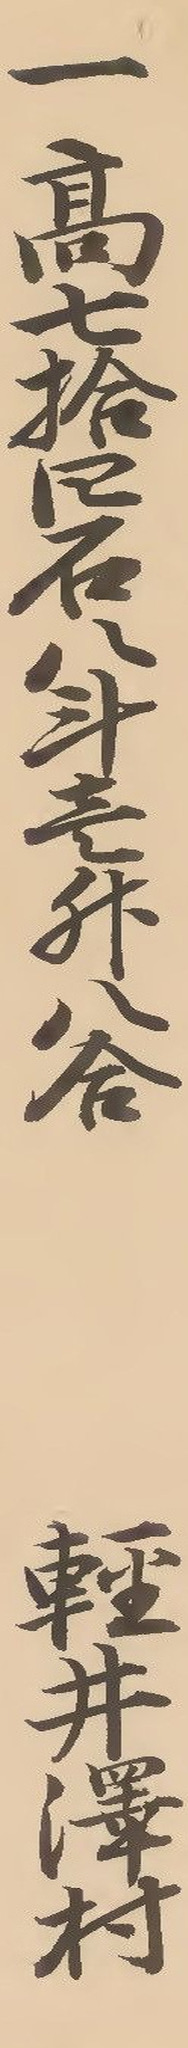一高七拾四石八斗壱升八合軽井沢村
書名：伊豆国郷帳
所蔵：国立公文書館 National Archives of Japan
